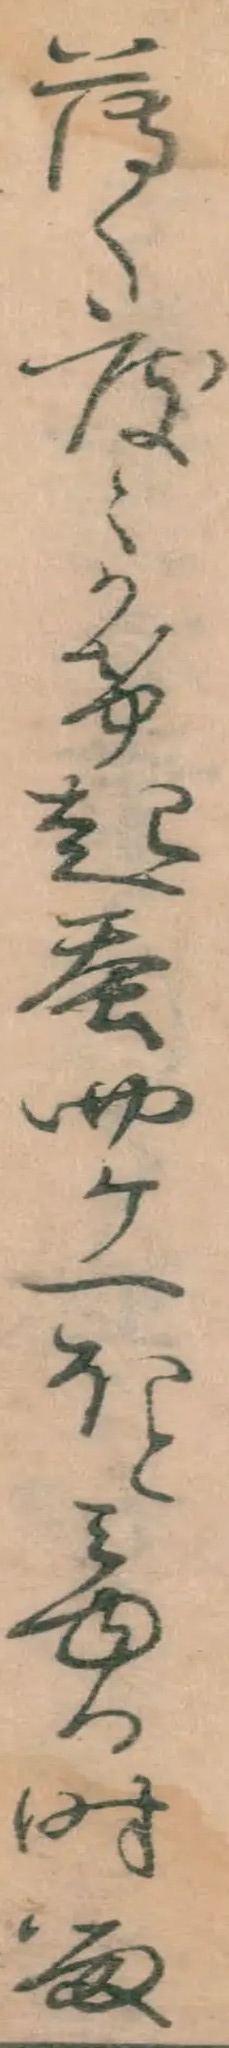薄く度々かけ起蚕四ヶ一ほとみゆる時留
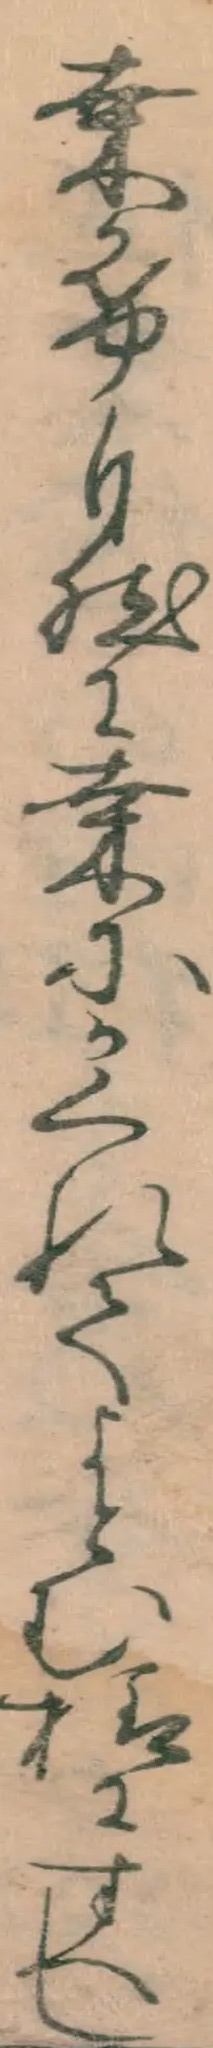桑かけ自然に桑にかくれてよとむ様にすへし
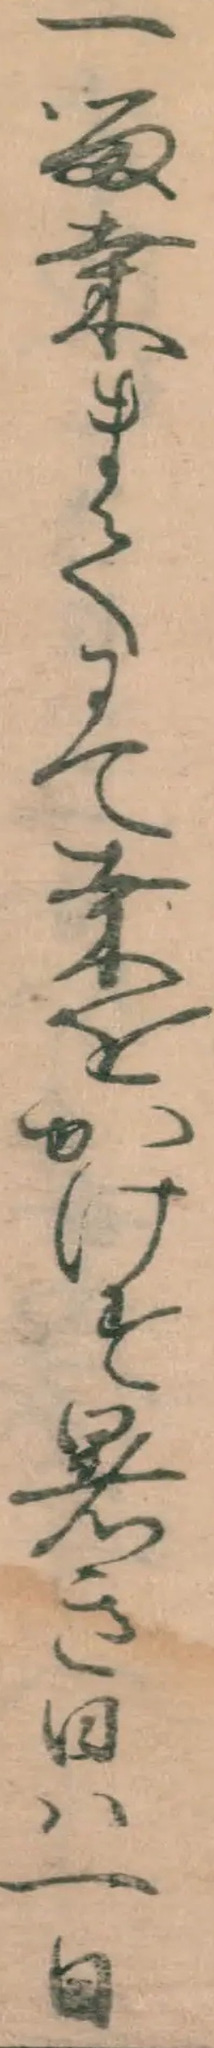一留桑まてにて桑をかけす暑き日は一日
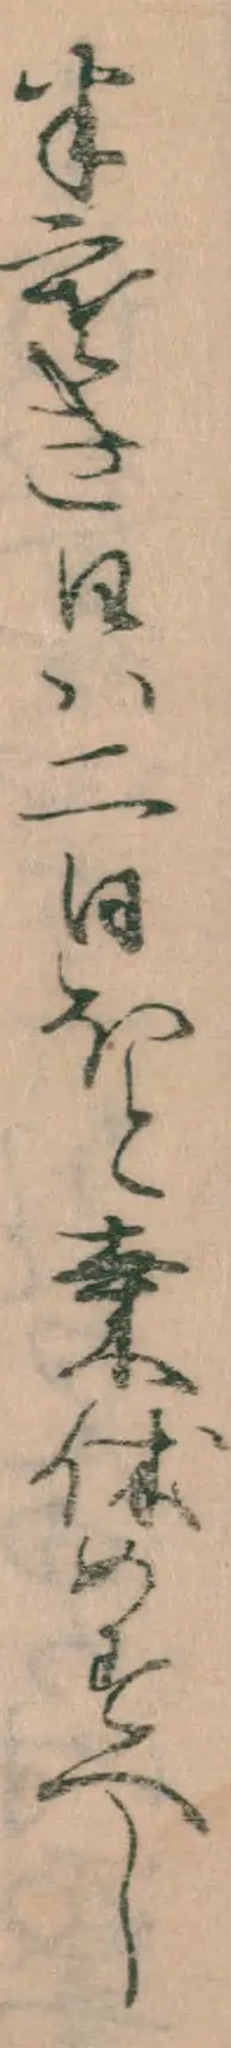半寒き日は二日ほと桑休めすへし
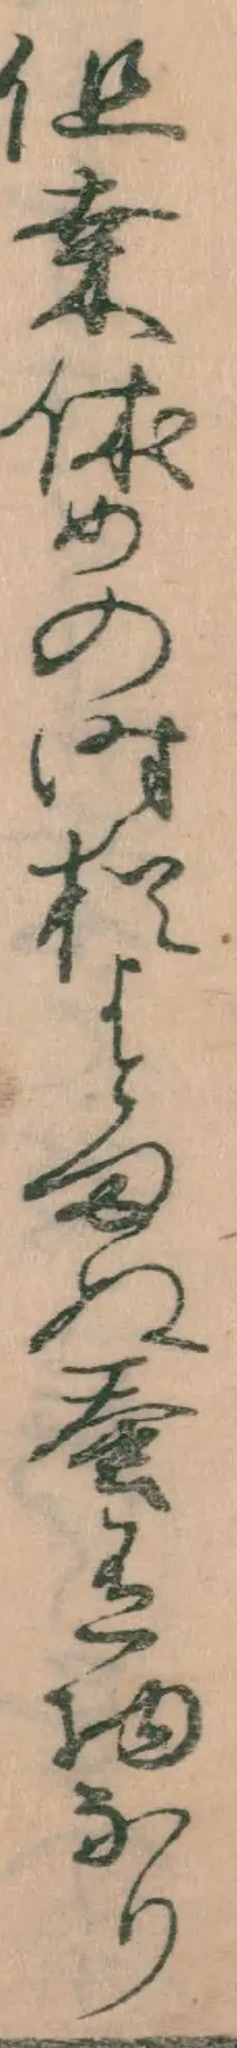但桑休めの時猶よとまぬ蚕有物なり
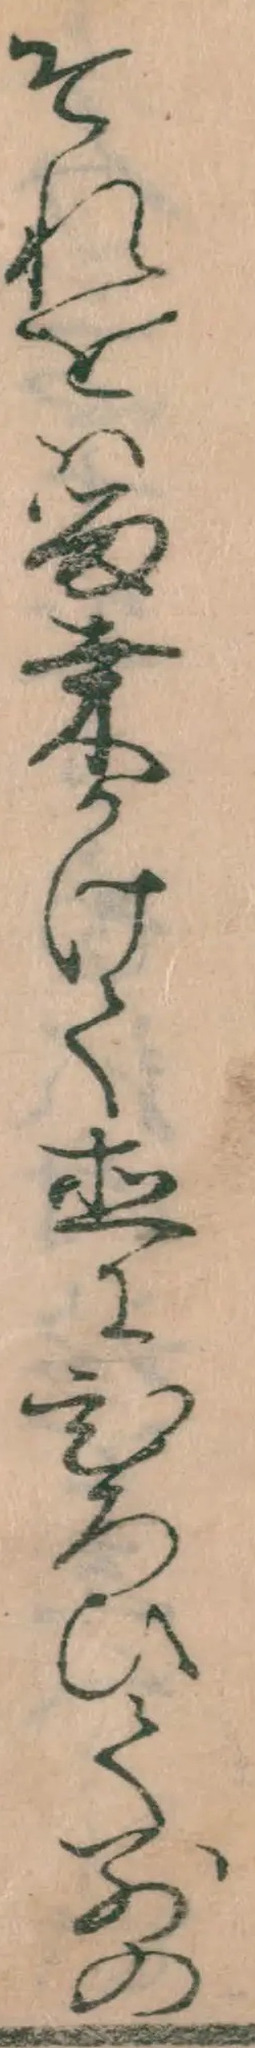それをは留桑かけて直にひろひて別の
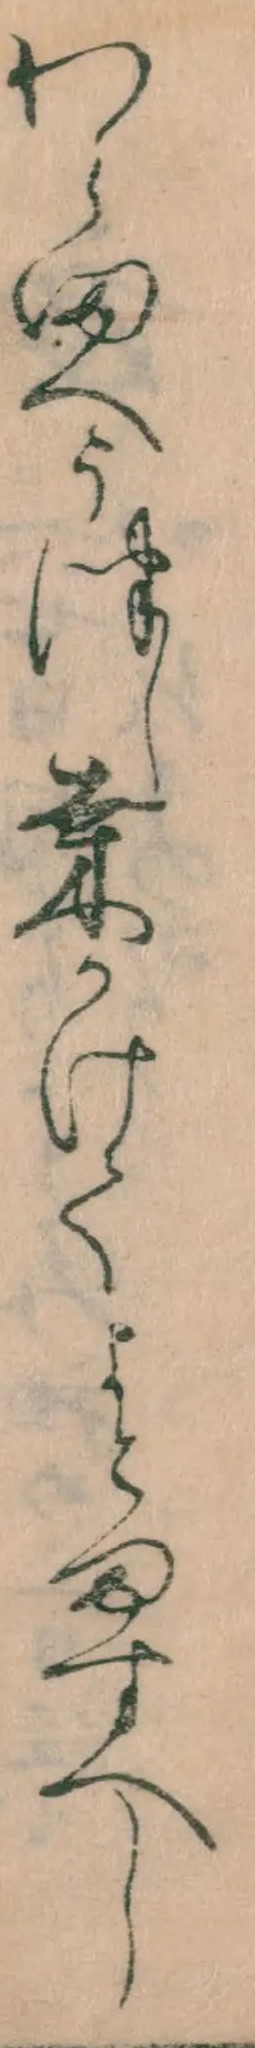わら田へうつし桑かけてよとますへし
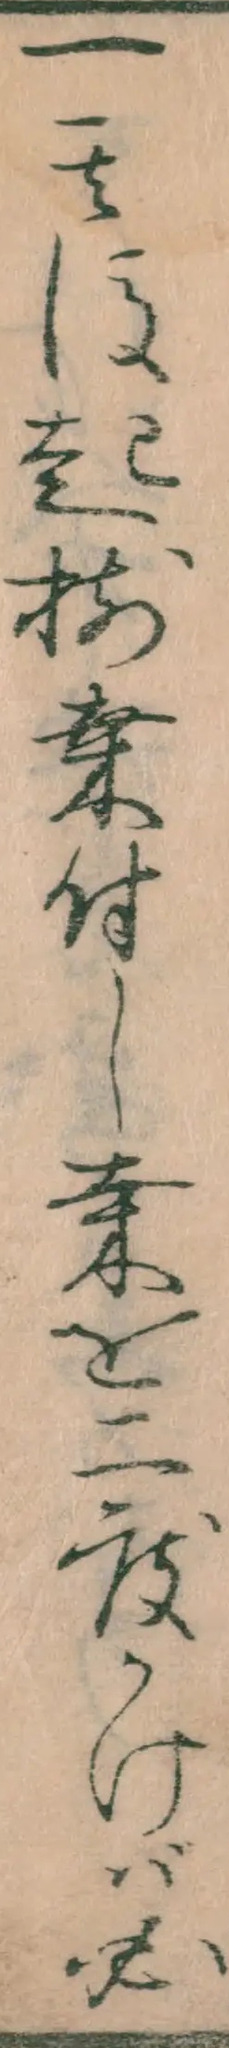一其後起揃桑付し桑を二度かけば必
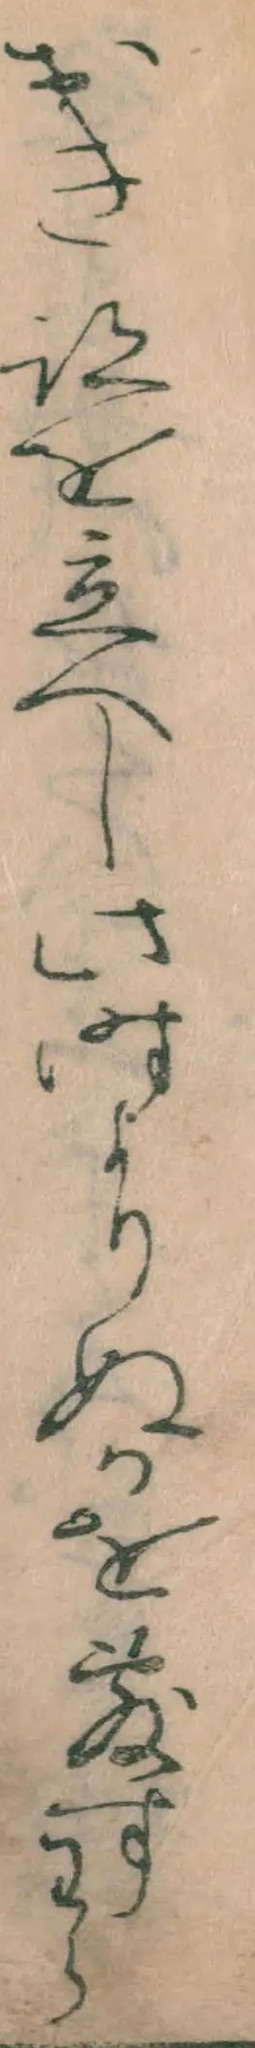おき跡を立へし此時よりぬかを敷すわら
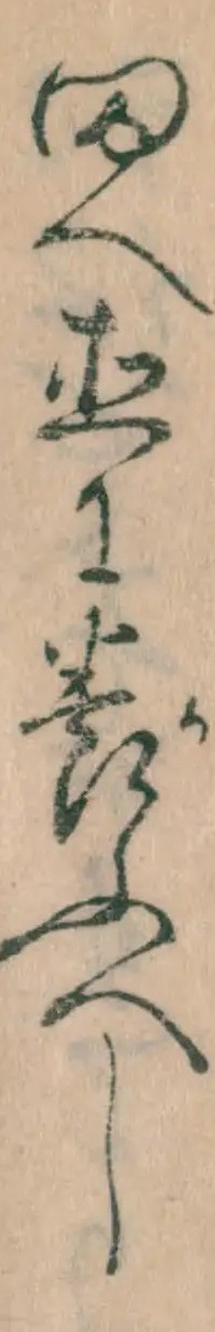田へ直に養ふへし

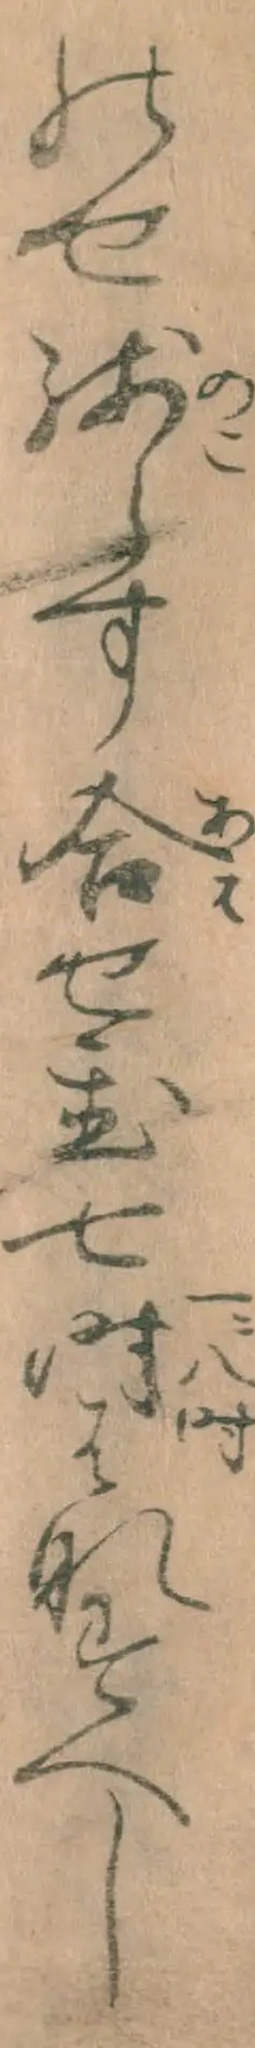のせ残らす合せ置七時はなすへし
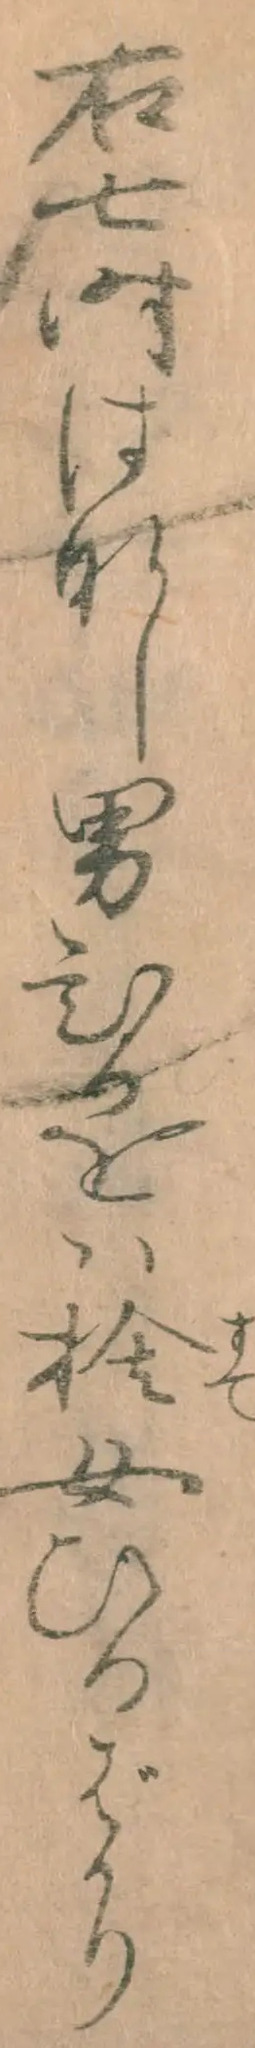右七時はなし男ひるをは捨女ひるばかり
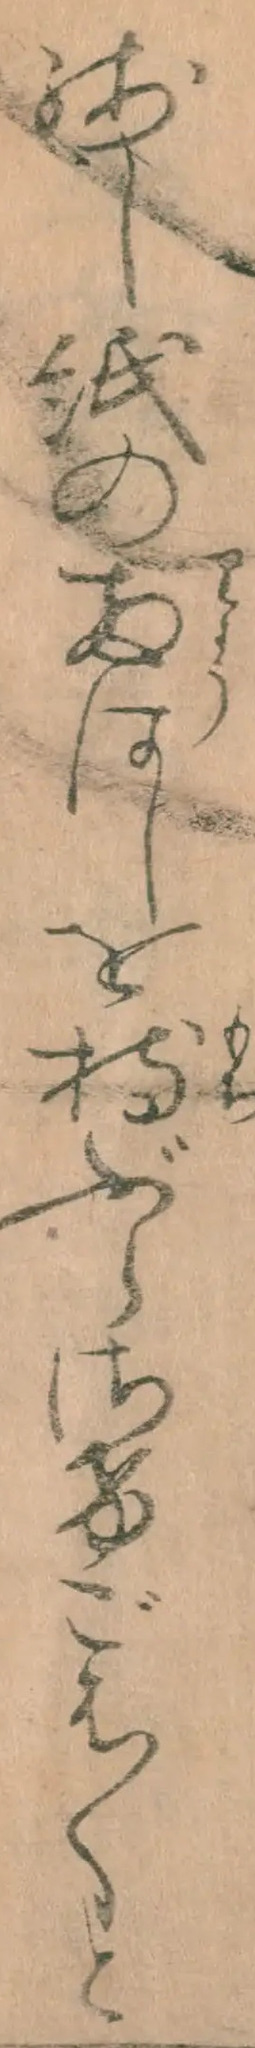残し紙の両はしを持ぶらさけごは〳〵と
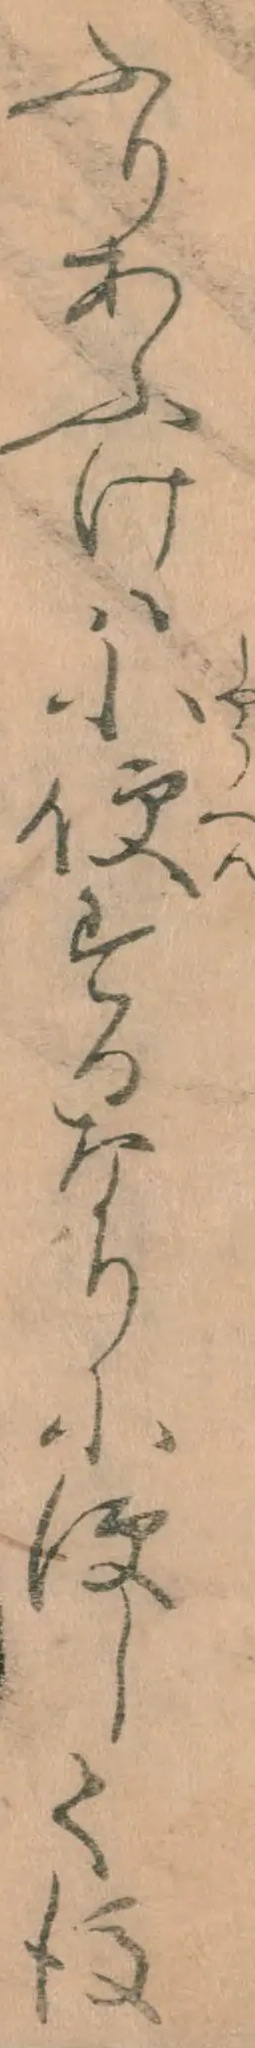ふりあふけは小便するなり小便して後
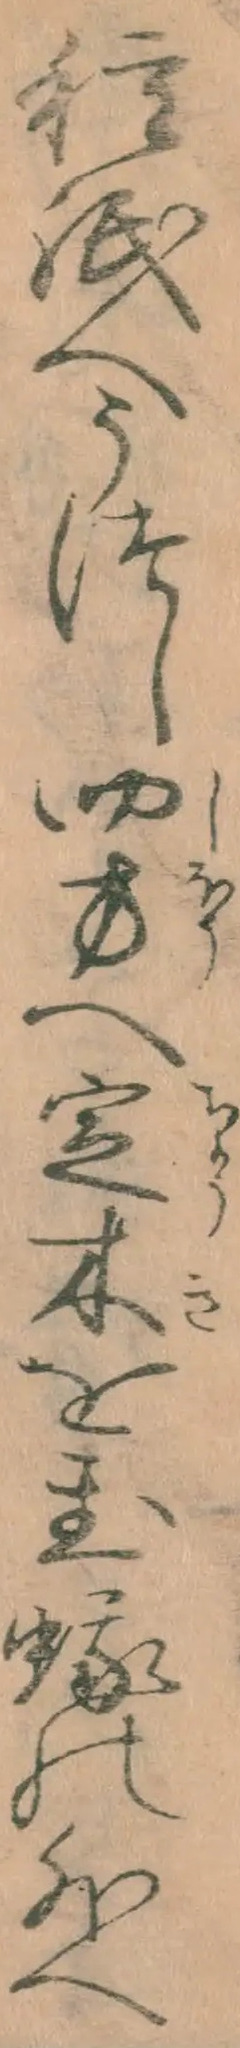種紙へうつし四方へ定木を置蛾の外へ
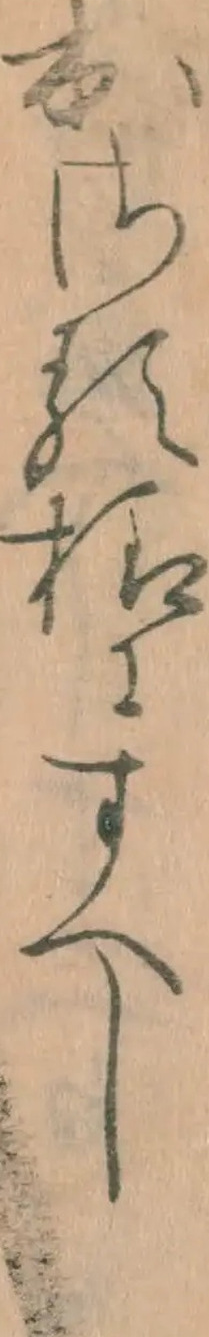出さる様にすへし
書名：養蚕手引
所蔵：国立国会図書館 National Diet Library, JAPAN
